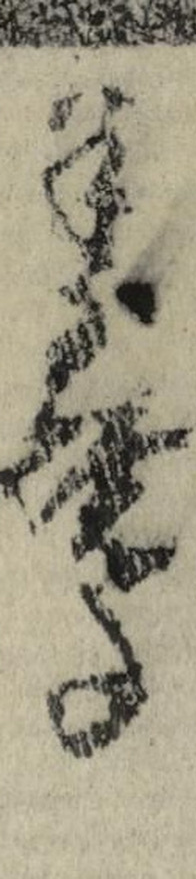半分焼る
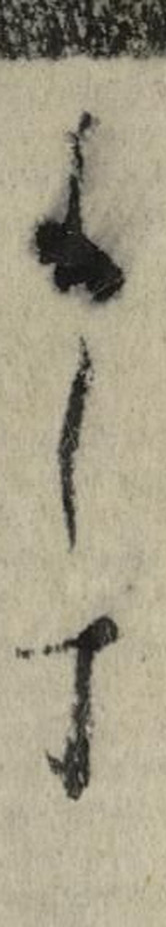よし丁
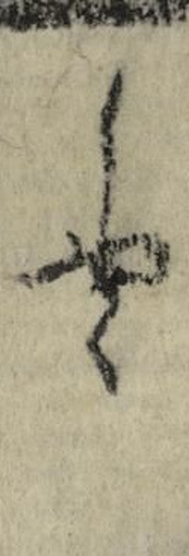しやく
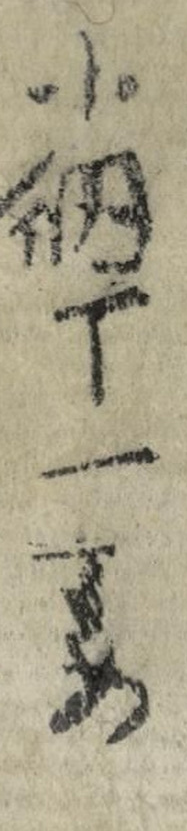小網丁一丁め
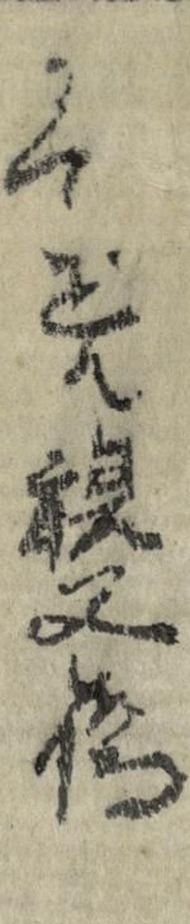にて止ル親父橋
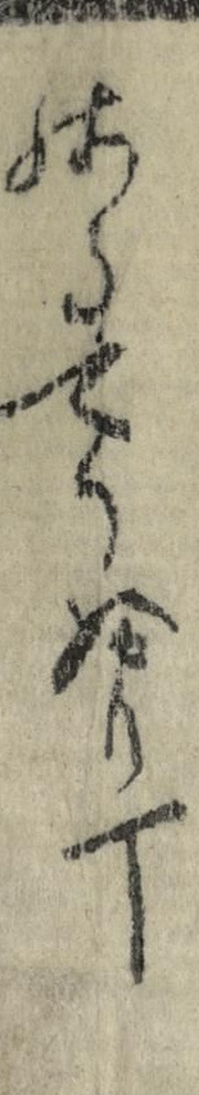残るてりふり丁
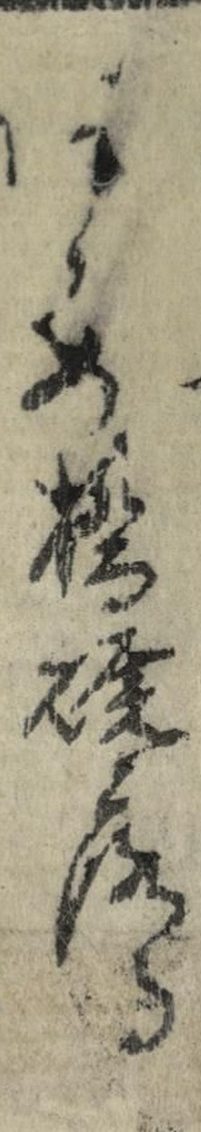あらめ橋焼落る
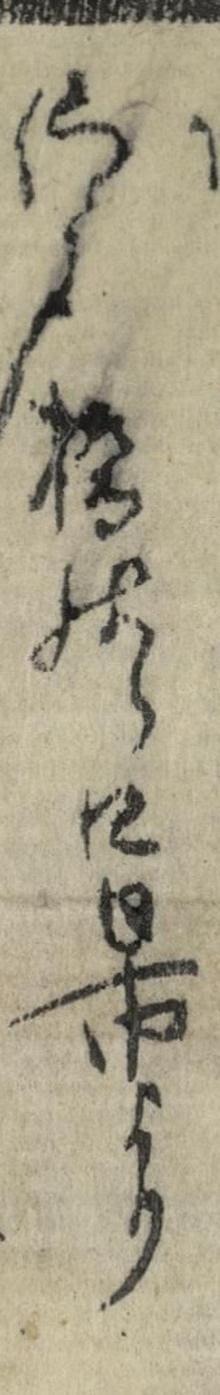江戸橋残り四日市より
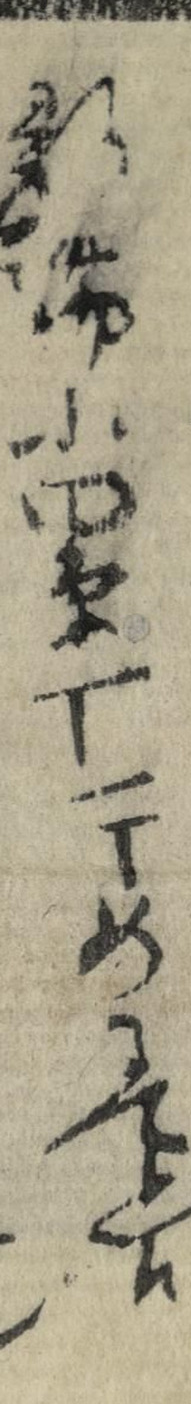新場小田原丁一丁めにて止ル
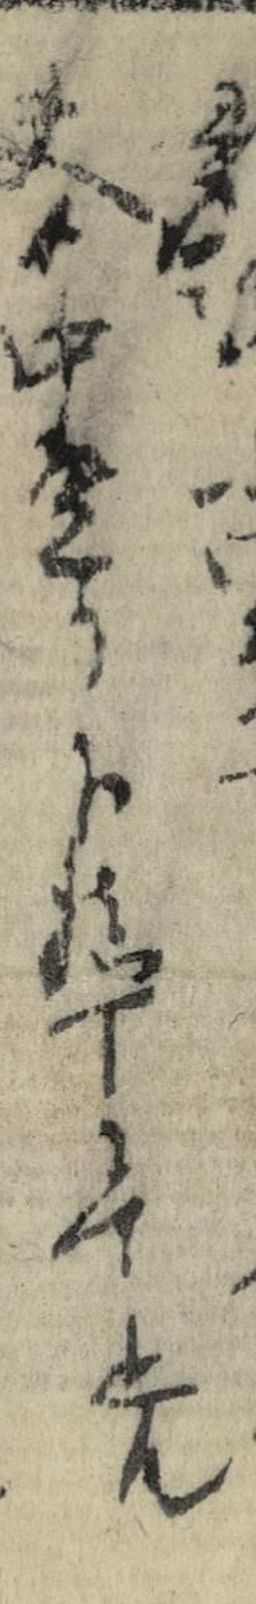夫ゟ中通り丁にて止ル
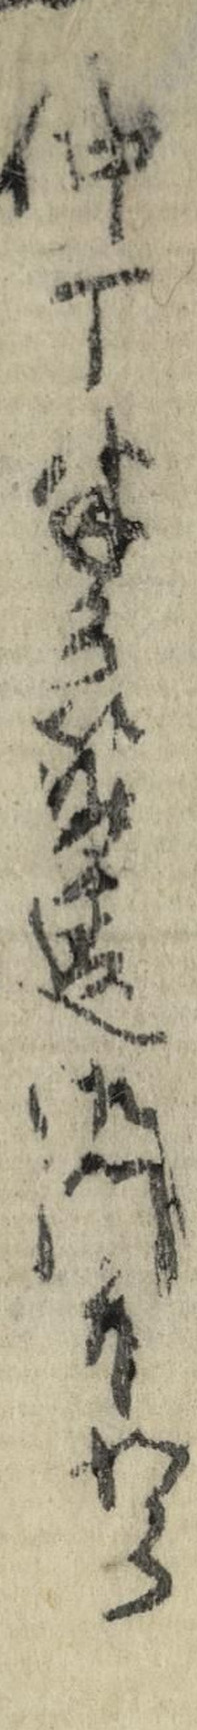仲丁半分筋違御門外わら
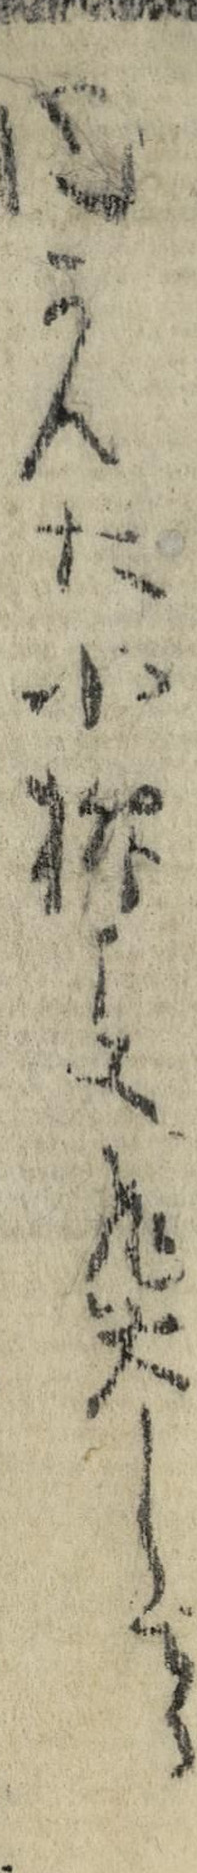内かんた小柳丁へ飛火して
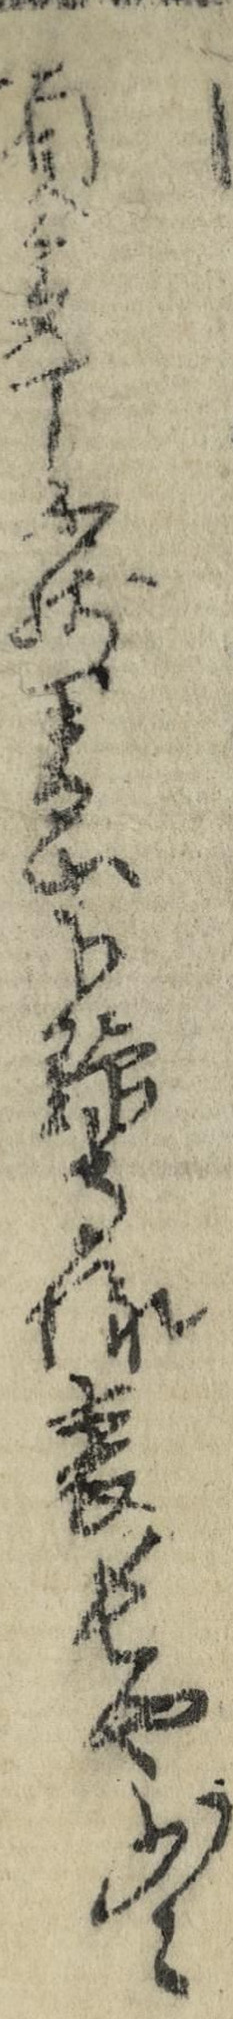多丁不残青山下野守様裏長や少々
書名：焼場所方角繪圖
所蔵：東京大学地震研究所図書室 Earthquake Research Institute Library, The University of Tokyo, JAPAN
